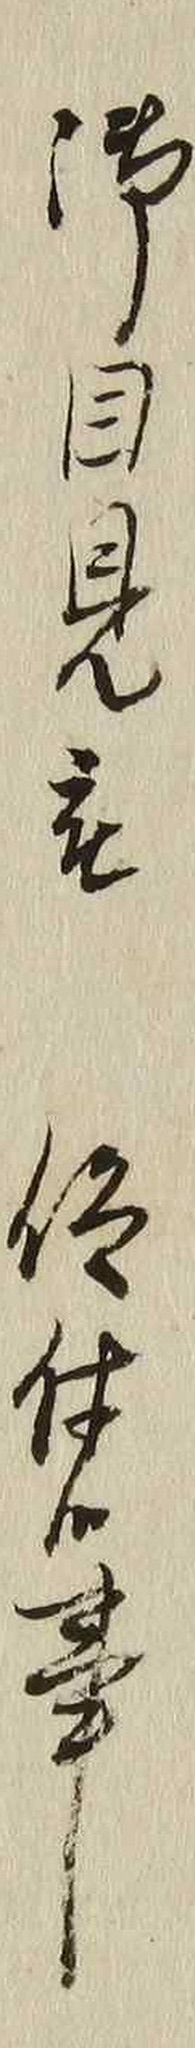御目見被仰付候事
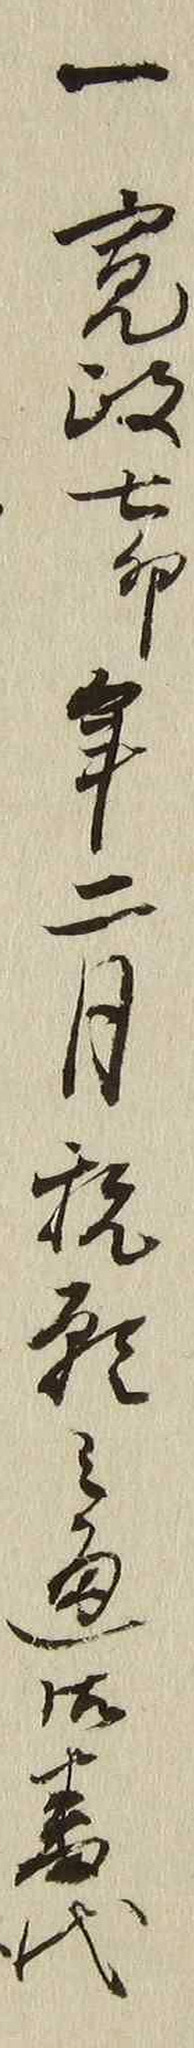一寛政七卯年二月親願之通御番代
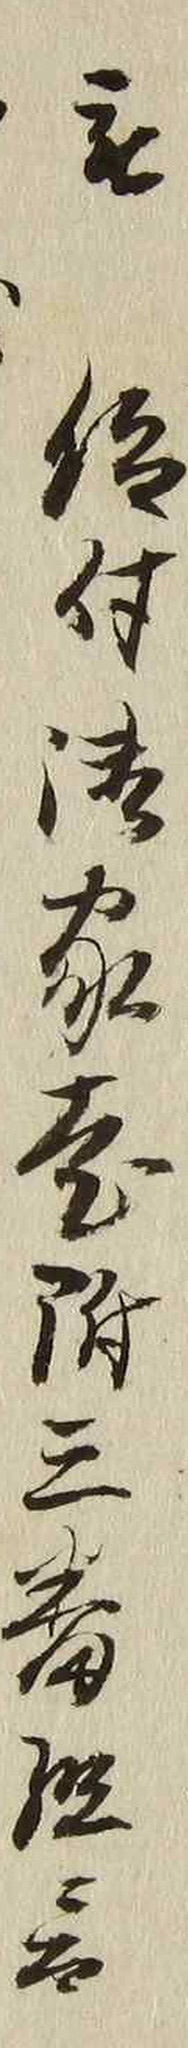被仰付御家老附三番組ニ而
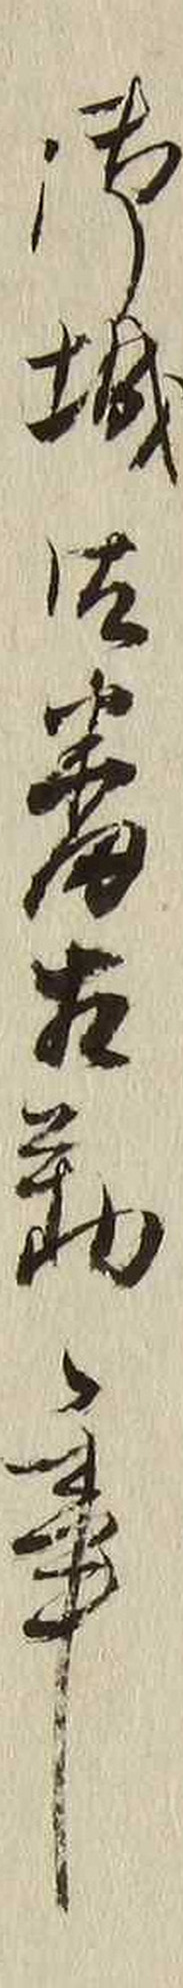御城御番相勤候事
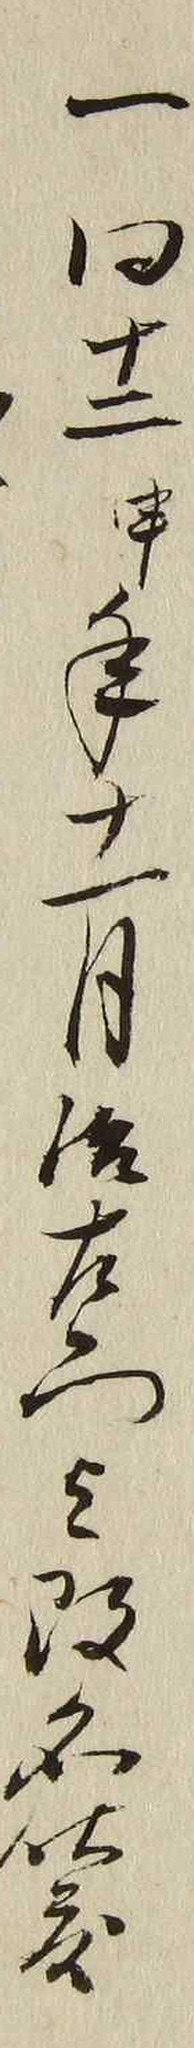一同十二申年十一月治左衛門与改名仕度
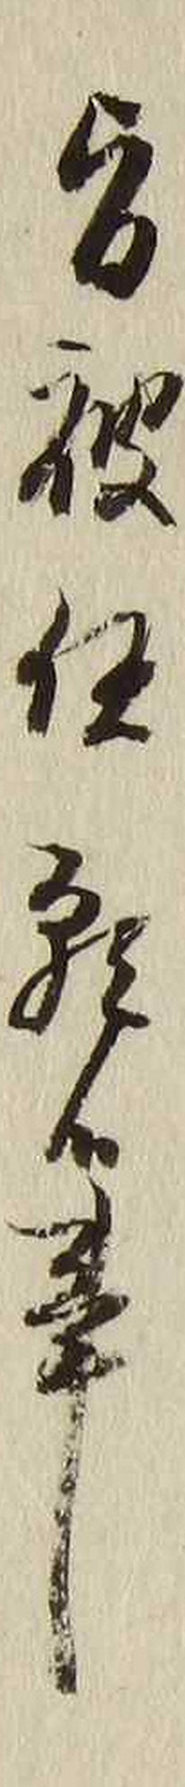旨被任願候事
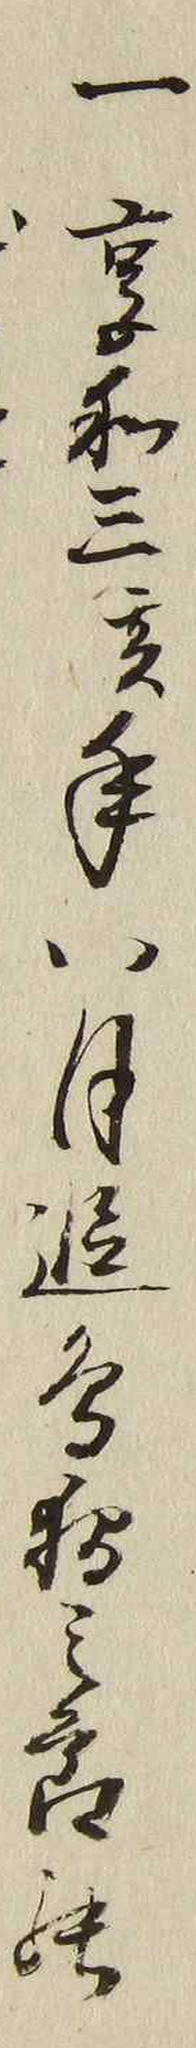一享和三亥年八月追鳥狩之節罷
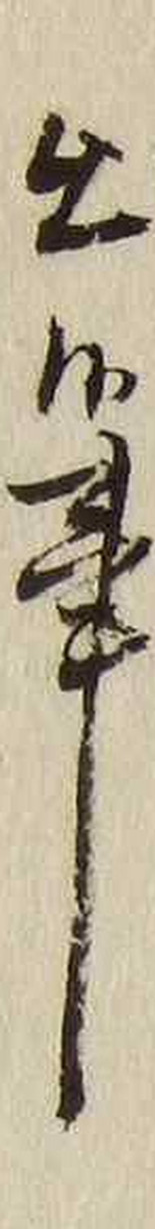出候事
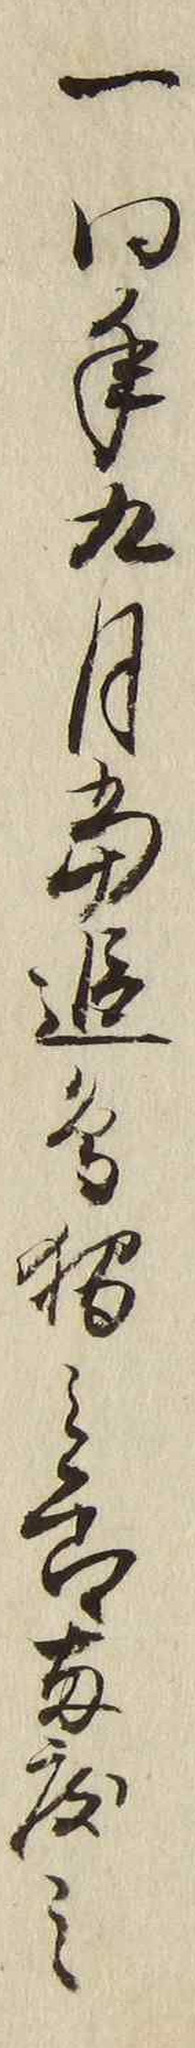一同年九月当追鳥狩之節両度之

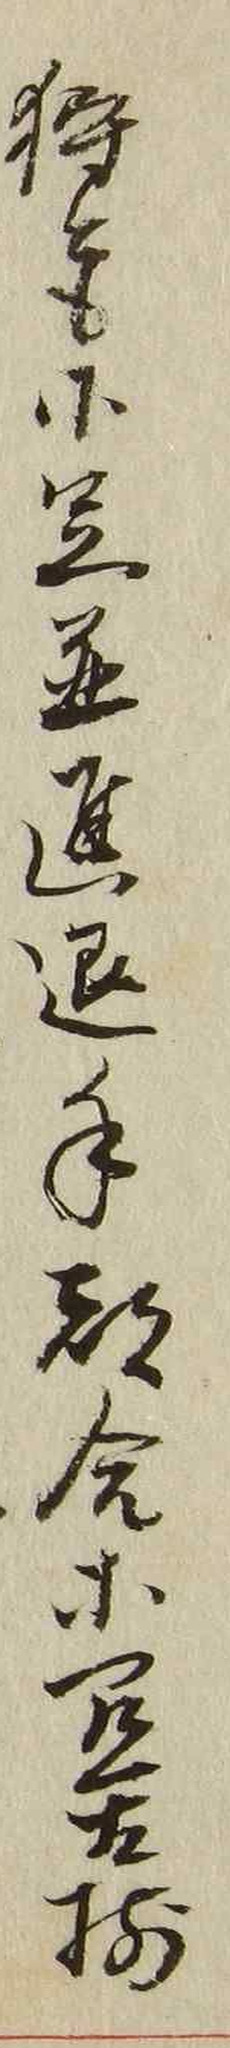狩ともに足並進退手都合等宜相揃
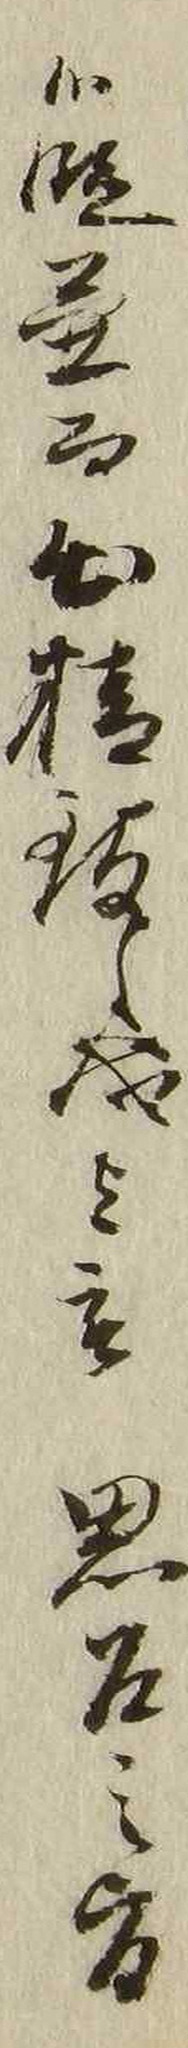候段兼而出精致候儀与被思召之旨
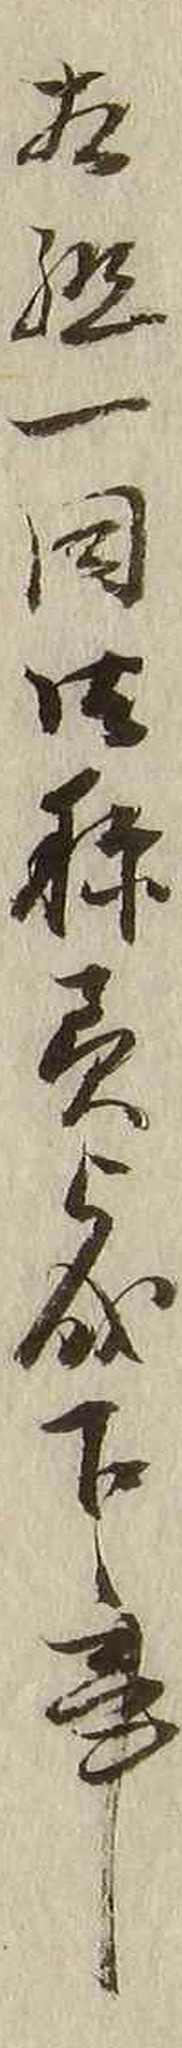相組一同御称美被成下候事
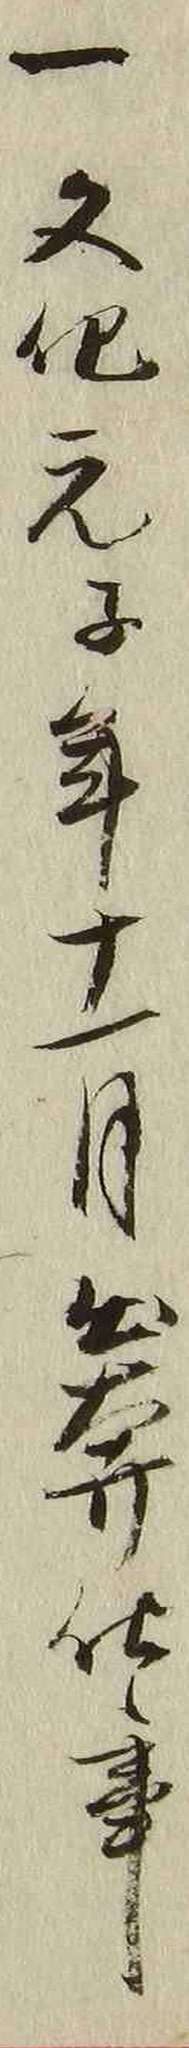一文化元子年十一月出奔仕候事
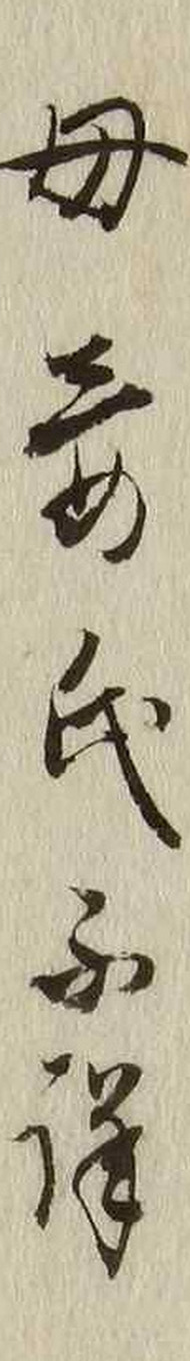母妾氏不詳
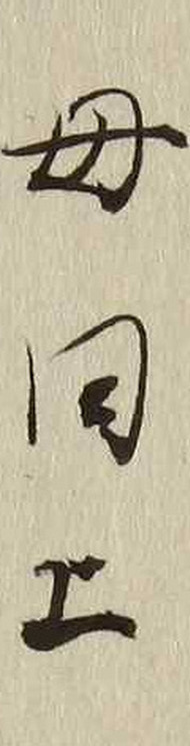母同上
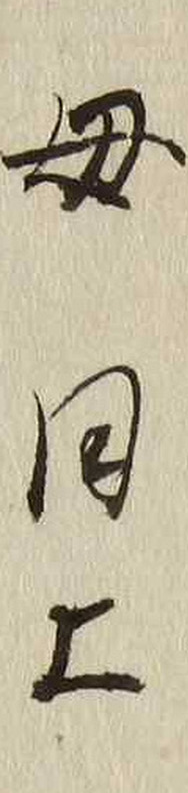母同上
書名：諸士系譜　巻之348　も之部4
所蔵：会津若松市立会津図書館
